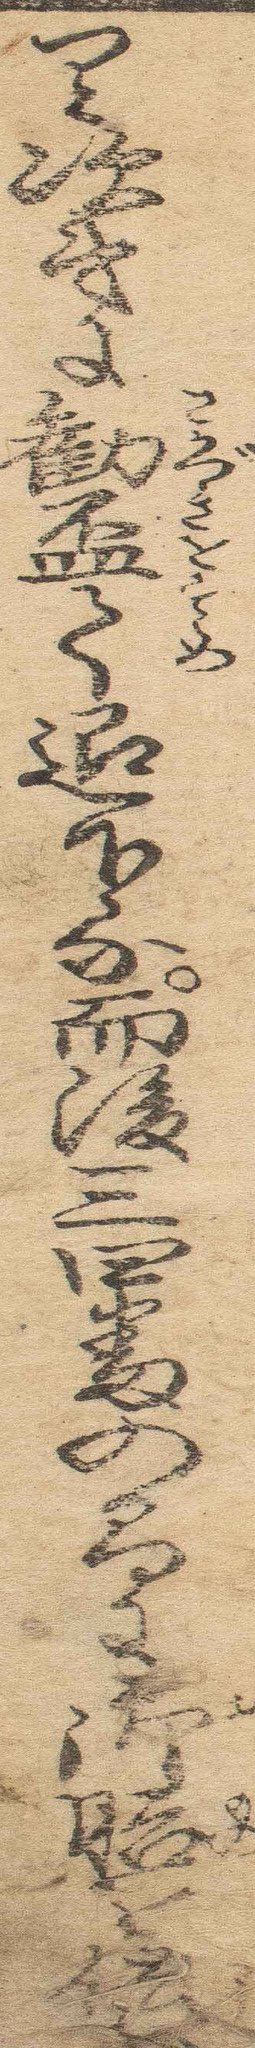り次第に勧盃て退下る。而後三四番の間に御膳を供す

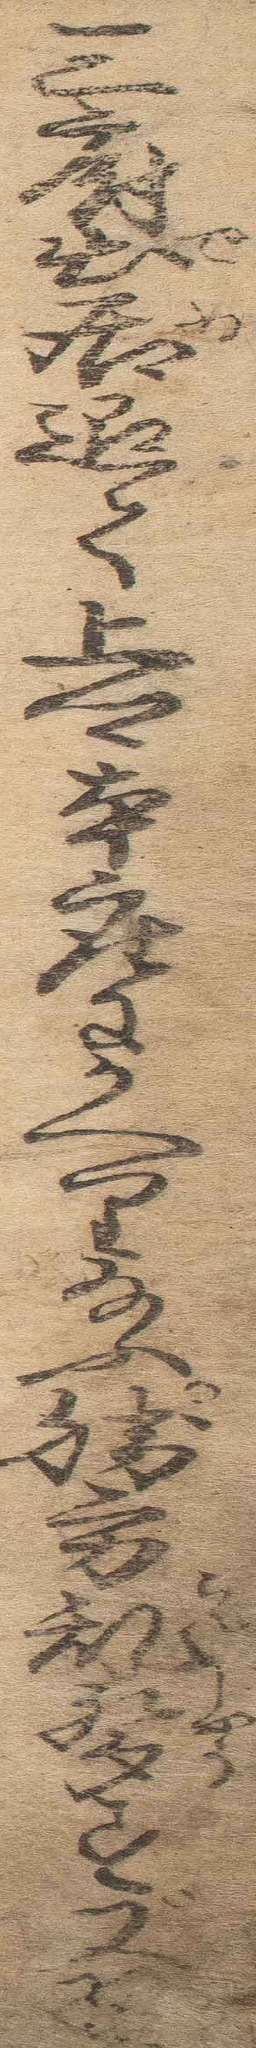三府出居退て上卿本座にかへり給ふ。勝方乱声す。又翌日
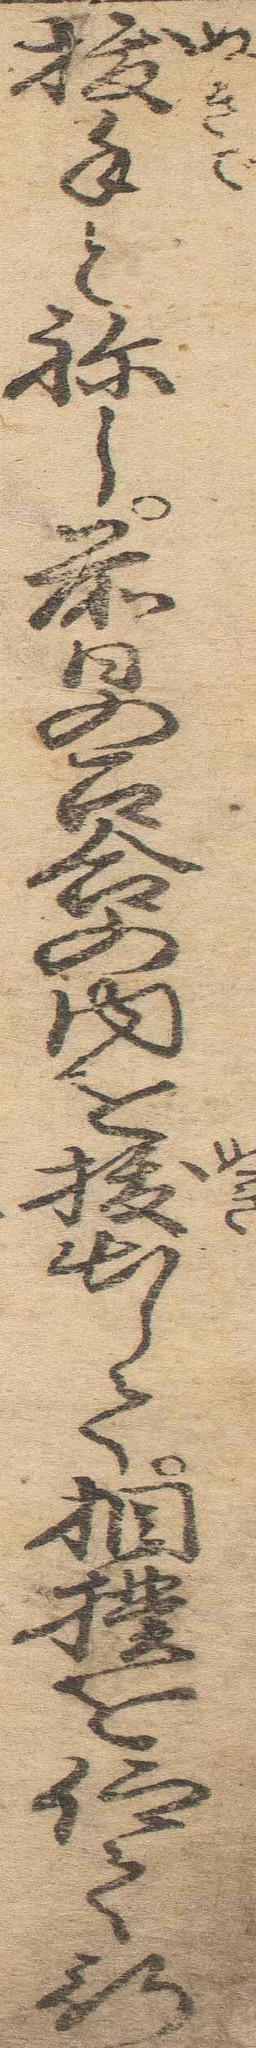抜手と称し。前日の召合の内を抜出して。相撲を仰て行
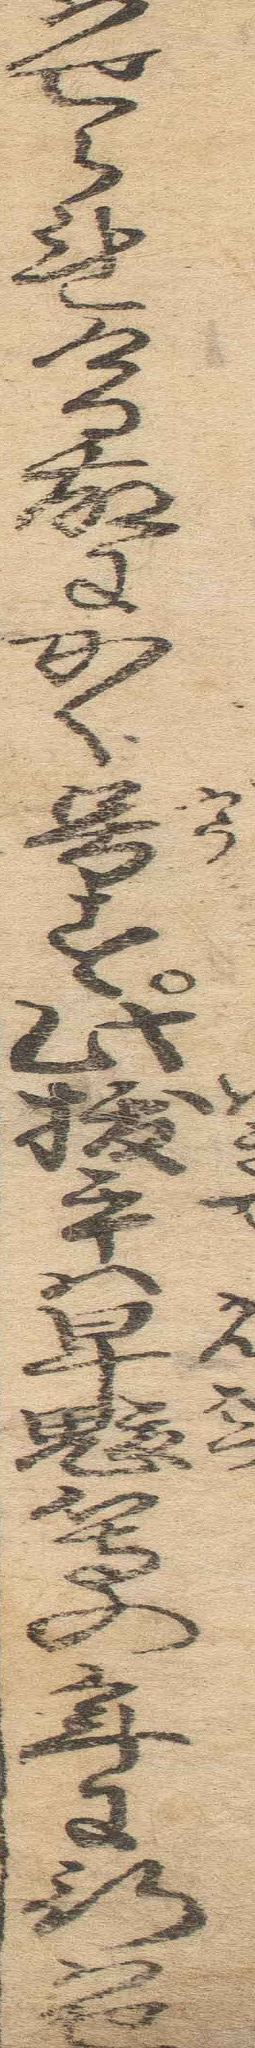はせられける故にかく号す。此抜出は旱魃等の年に行はせ
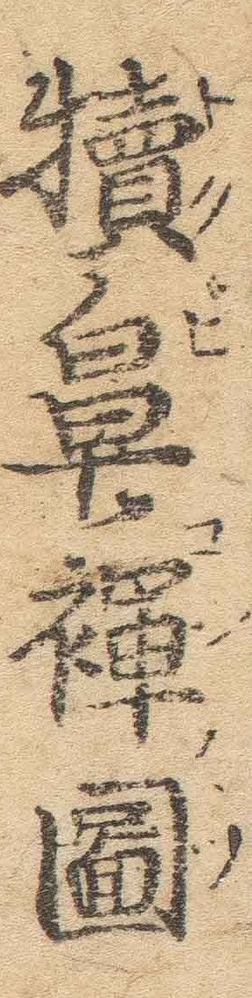犢鼻褌圖
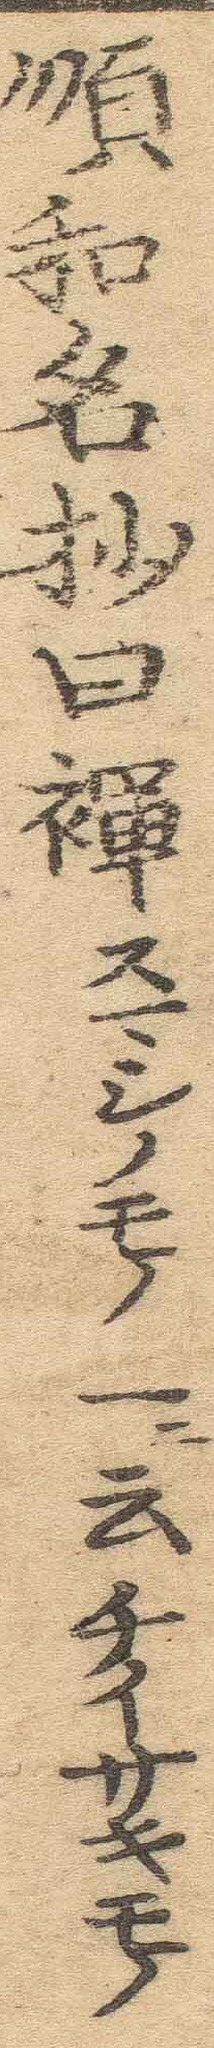須和名抄曰褌スマシノモノ一云チイサキモノ
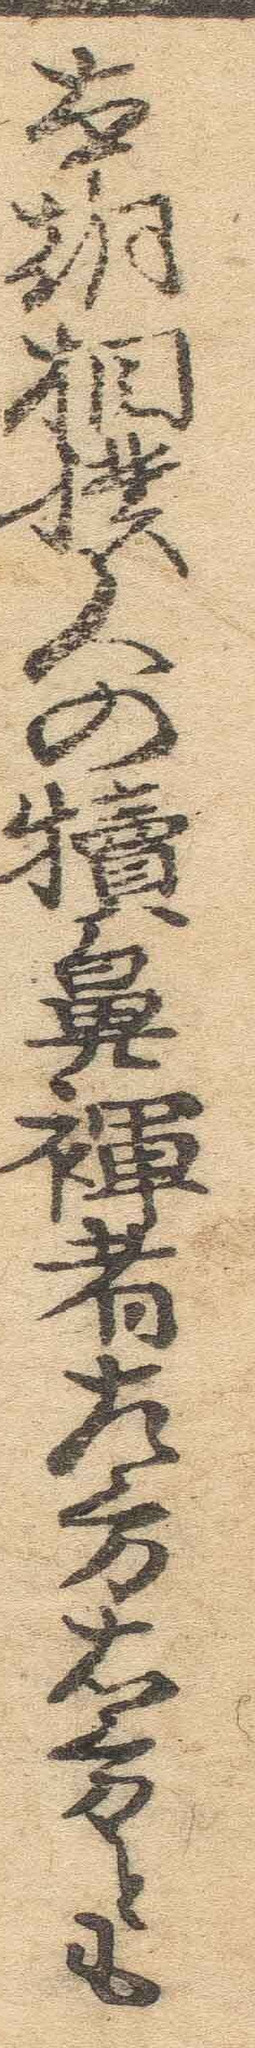本朝相撲人の犢鼻褌者左方右方とも
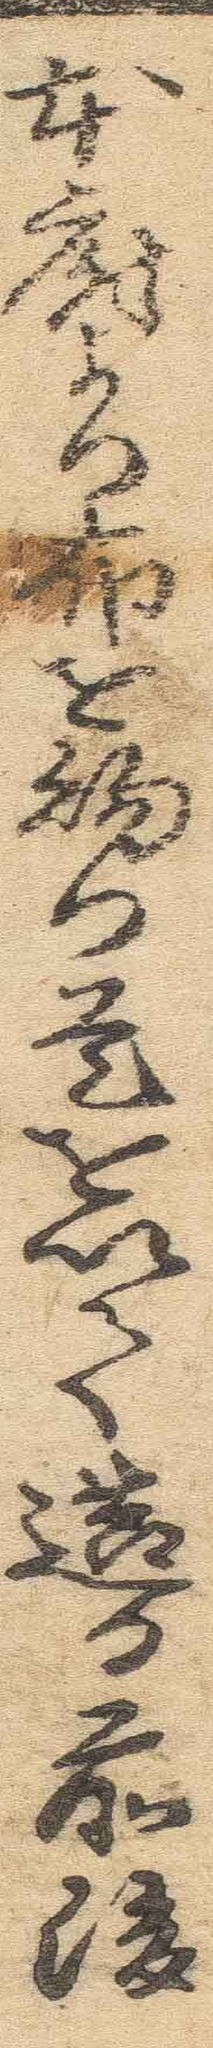本府より布を賜り是を以て造る前後
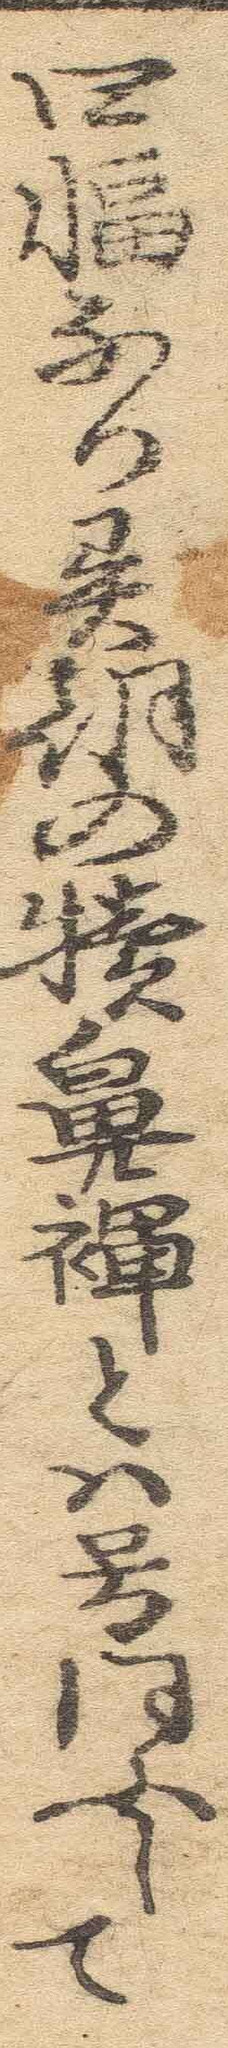四幅なり異朝の犢鼻褌とは号同ふして
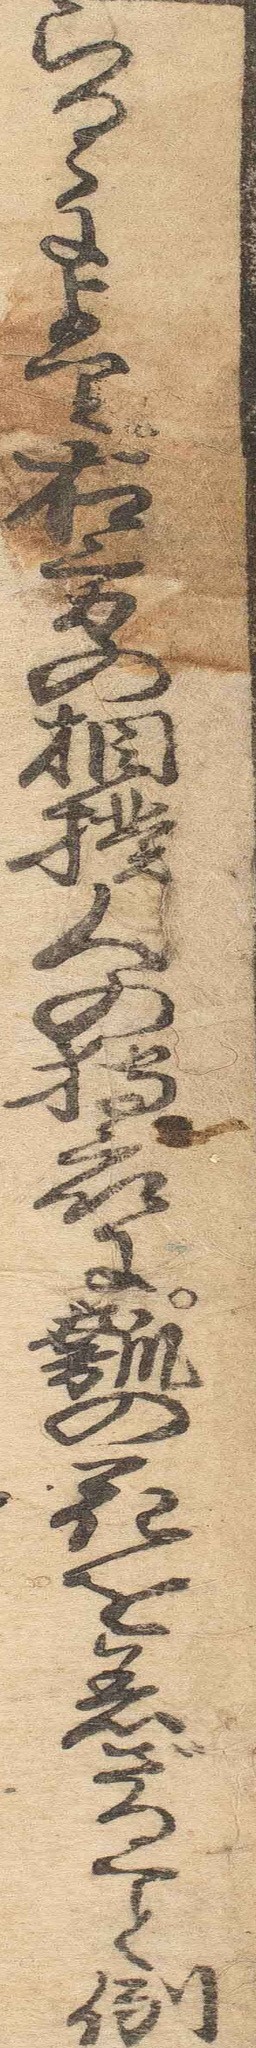らるゝにより右方の相撲人の狩衣に。瓠の花を着ざること例
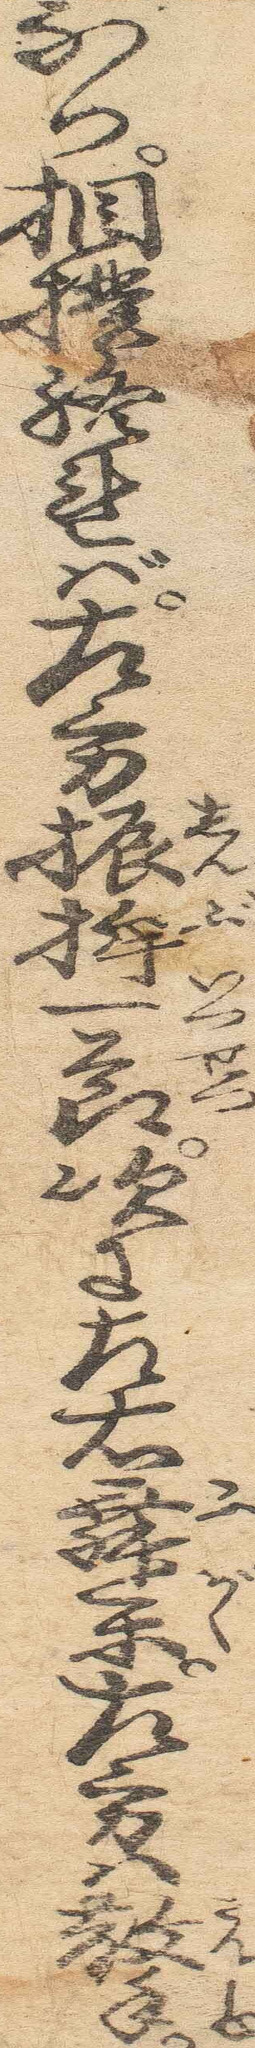なり。相撲終れば。右方振捊一節。次に左右舞楽左方は散手。
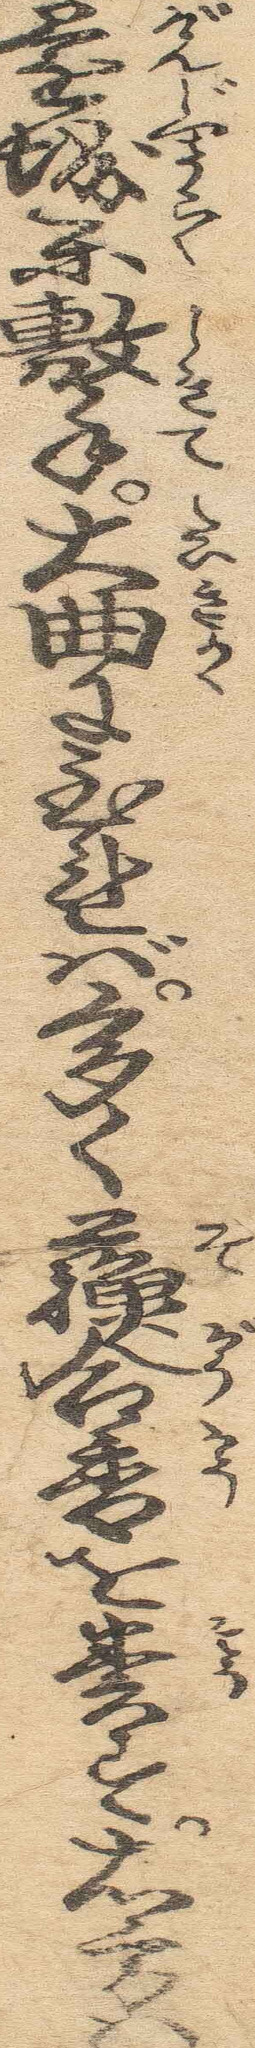還城楽敷手。大曲に至れば。多く蘇合香を奏す。右方は
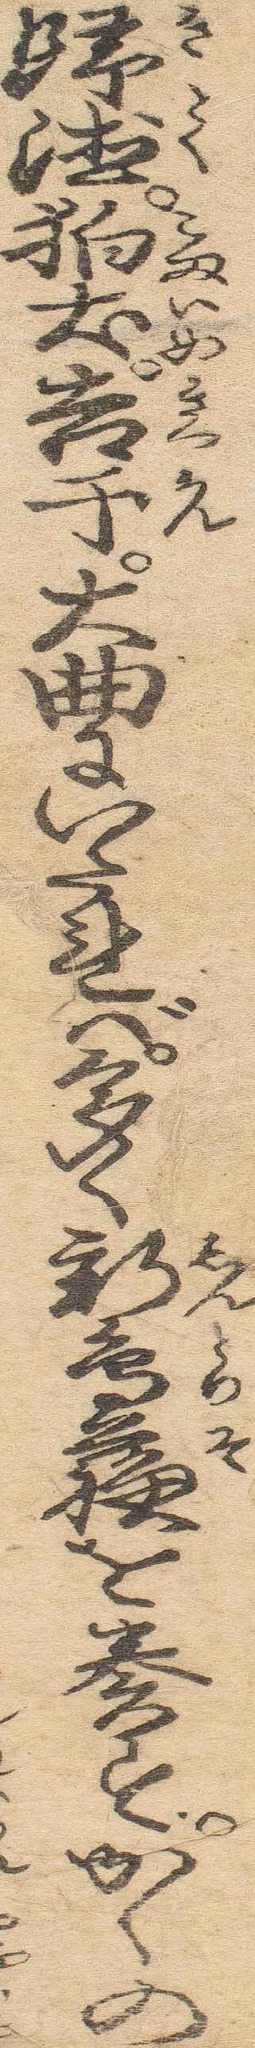帰徳。狛犬。吉干。大曲にいたれば。多く新鳥蘇を奏す。かくの
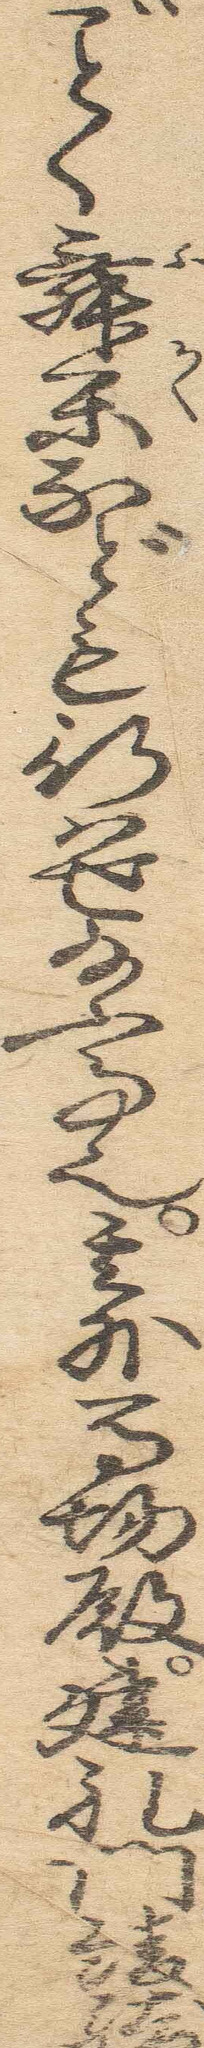ごとく舞楽なども行はせ給ふ事也。其外馬場殿。建礼門。綾綺
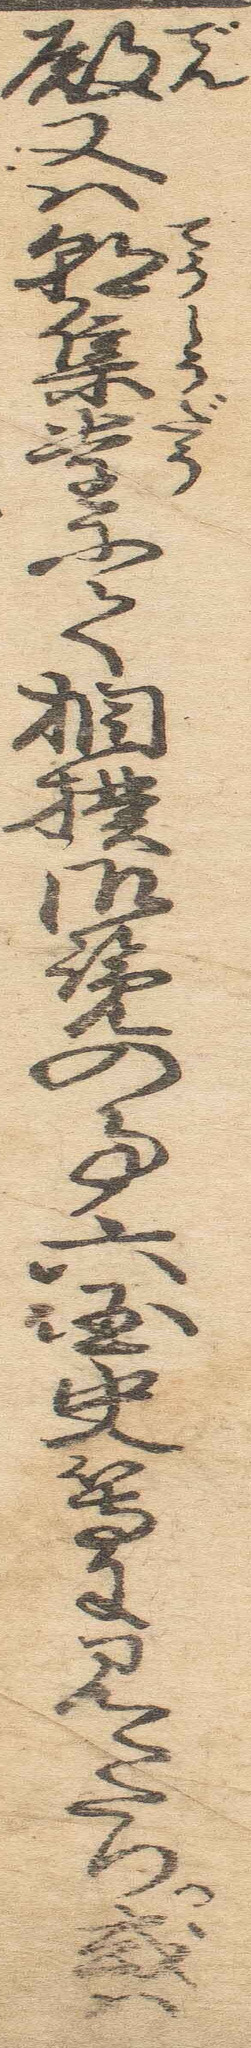殿又は朝集堂にて相撲御覧の事六国史等に見へたり。或は
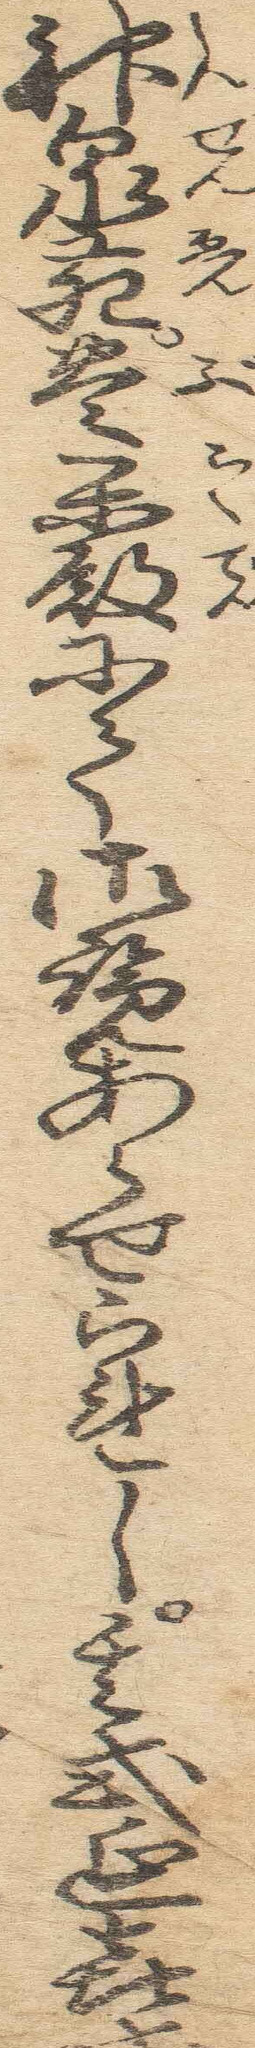神泉苑。豊楽殿にて御覧あらせられし。其式延喜式等に
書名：古今相撲大全
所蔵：東京学芸大学附属図書館 国文学研究資料館
